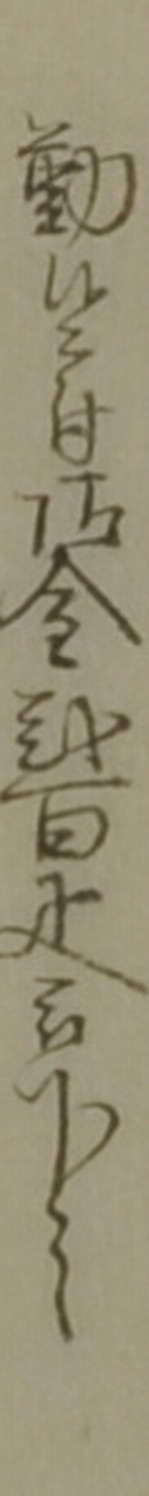勤候ニ付御金弐百疋被下之
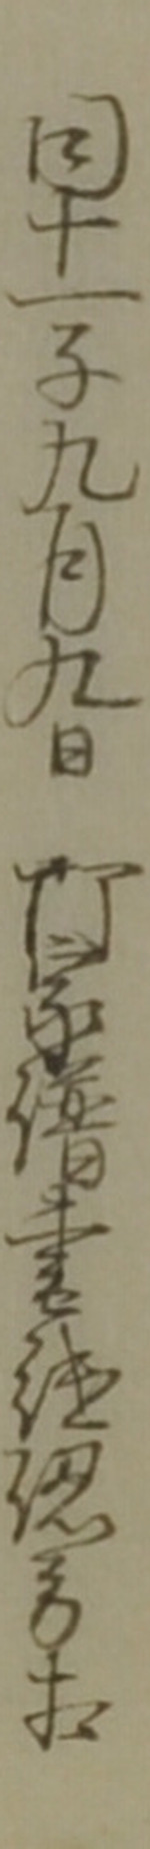一同十一子九月九日御家譜書継認方相
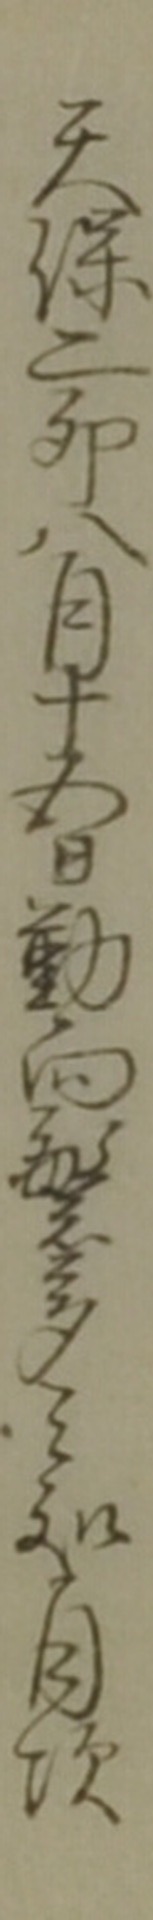一天保二卯八月十五日勤向繁多之処目次
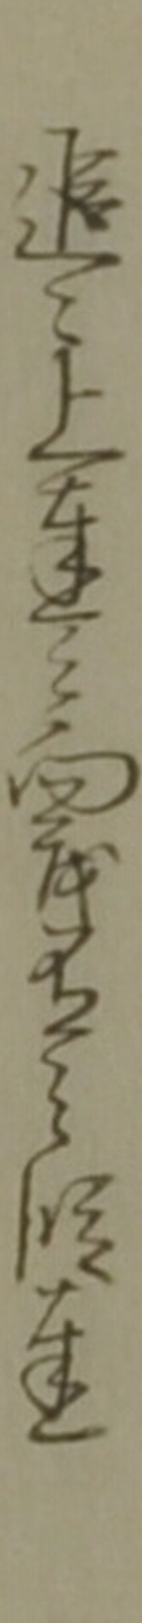追々上達之向茂有之段達
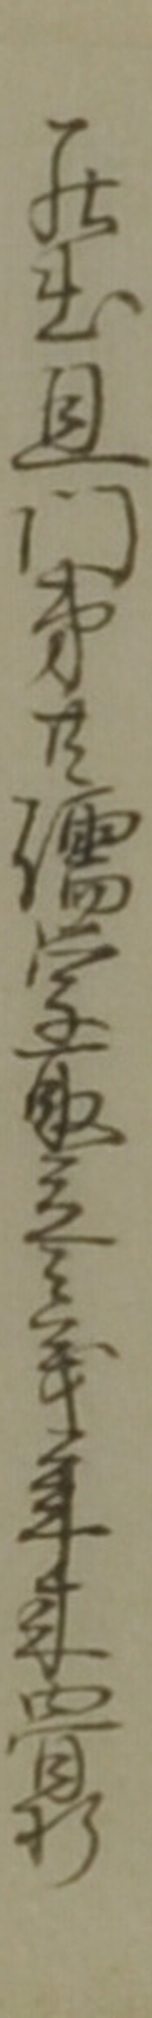罷出且門弟共儒学取立之義年来骨折
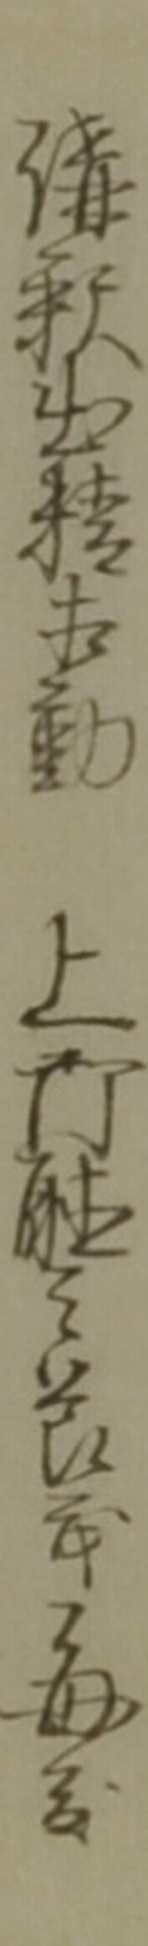講釈出精相勤上御聴之節茂毎度
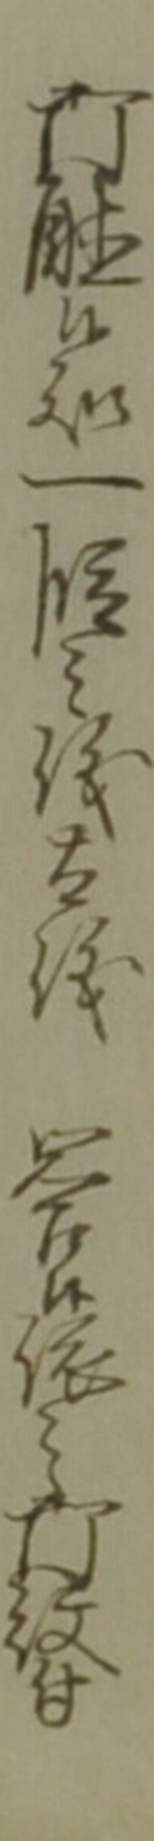御聴候処一段之儀太儀思召候依之御紋付
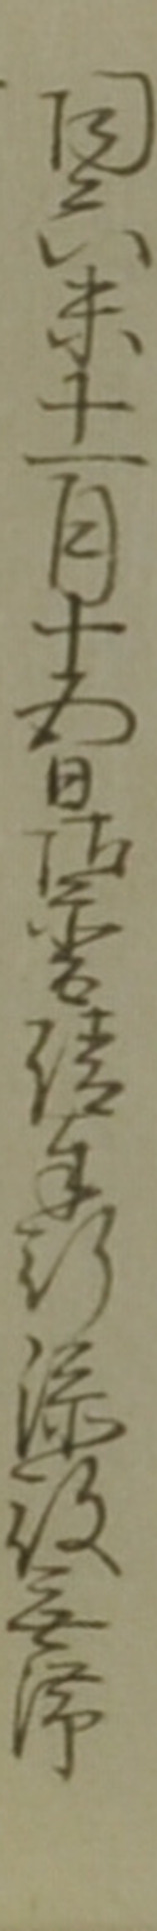一同六未十一月十五日御普請奉行添役無滞
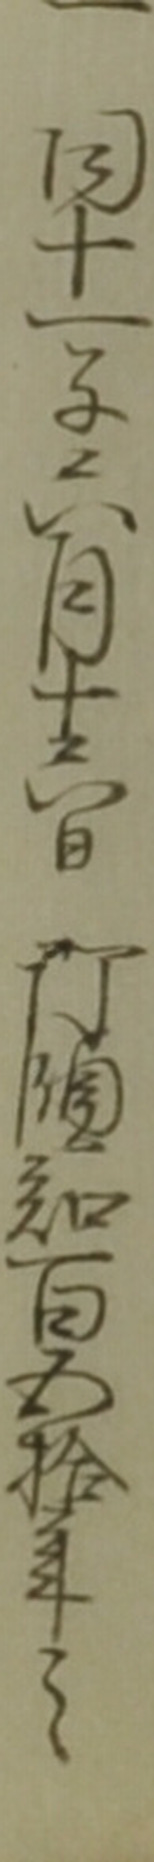一同十一子六月十六日御領知百五拾年之
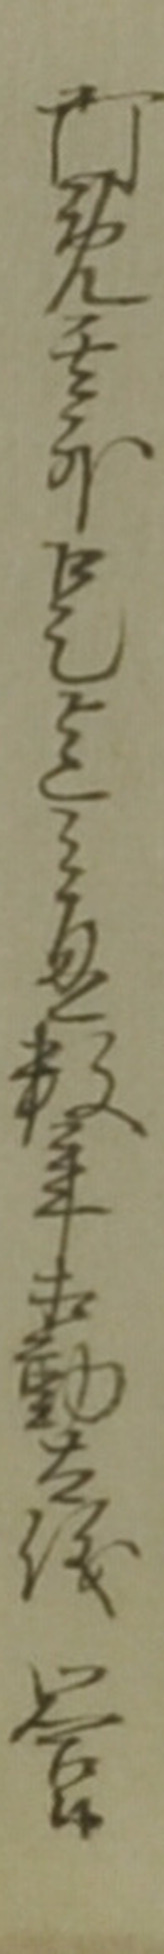御免其外是迄之通数年相勤太儀思召候
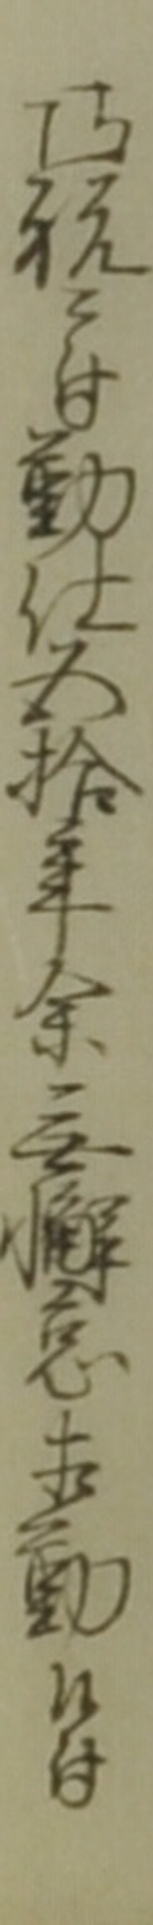御祝ニ付勤仕五拾年余無懈怠相勤候付
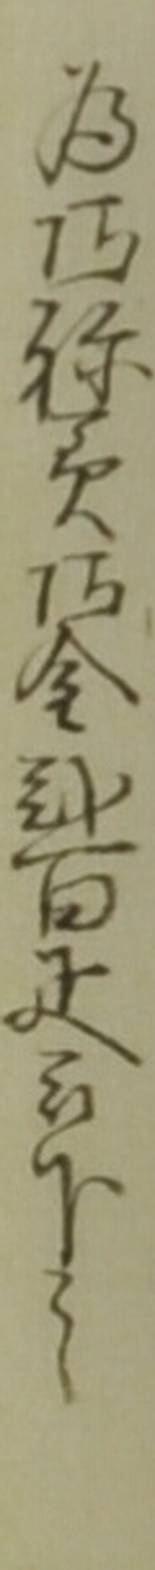為御祢美御金弐百疋被下之

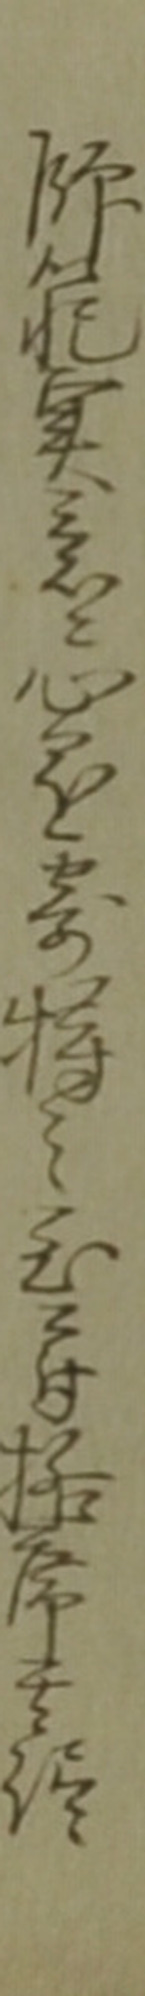師範実意心懸寄特之至ニ付格席其侭
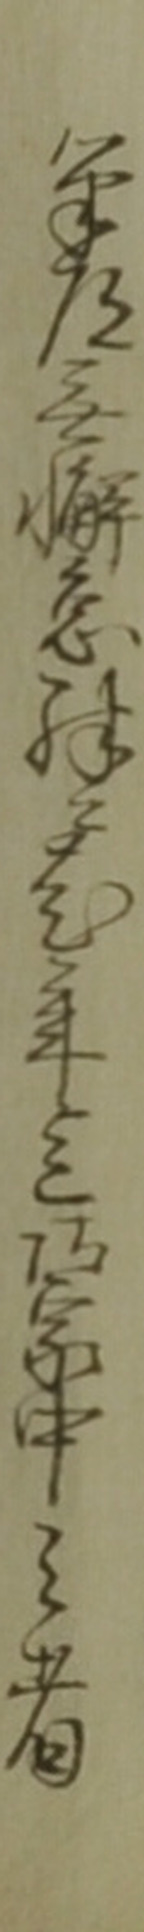筆道無懈怠殊老年迄御家中之者
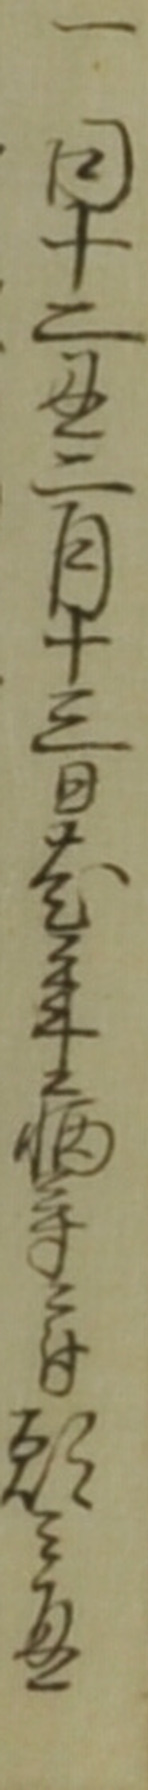一同十二丑二月十三日老年病気ニ付願之通
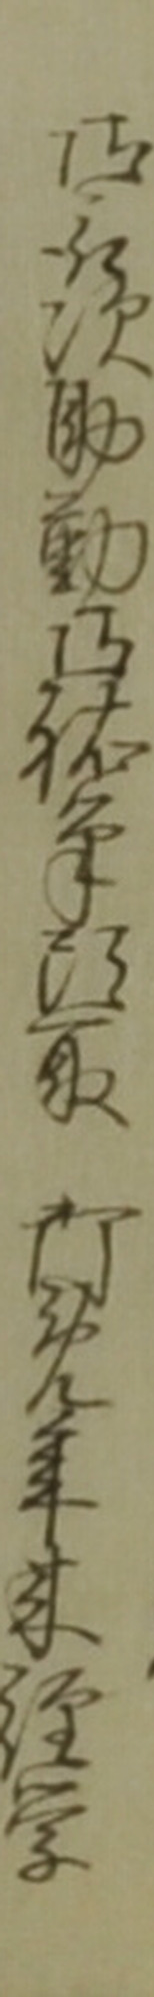御取次助勤御祐筆頭取御免年来経学
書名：無足廃家（弐）
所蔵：伊那市立高遠町図書館・合同会社AMANE
